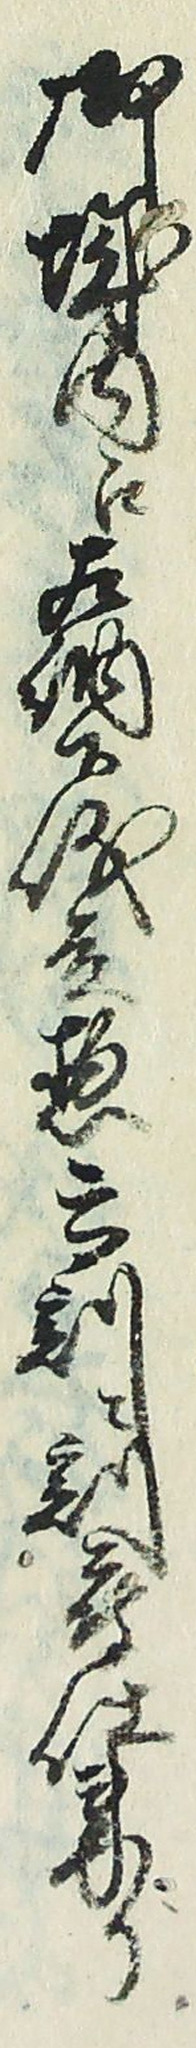御城内え相納候儀故惣高割に割符仕来り
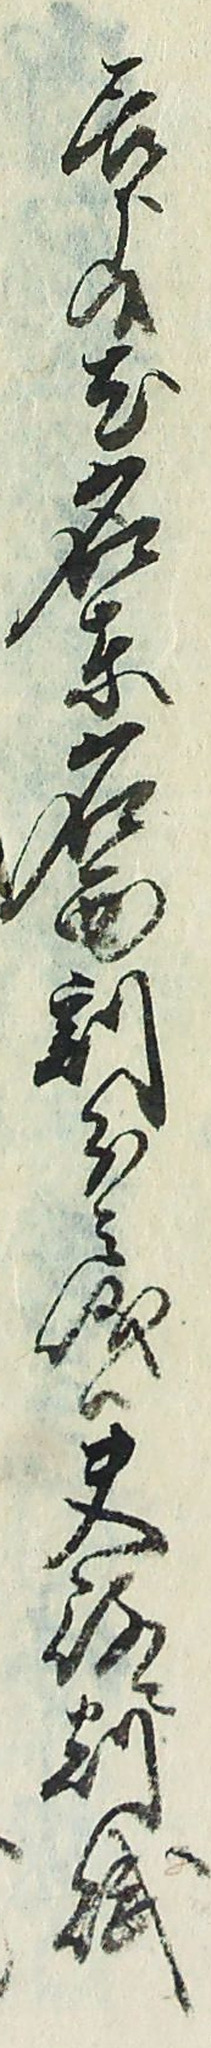居申候尤名東名西割分の儀は夫役に割賦
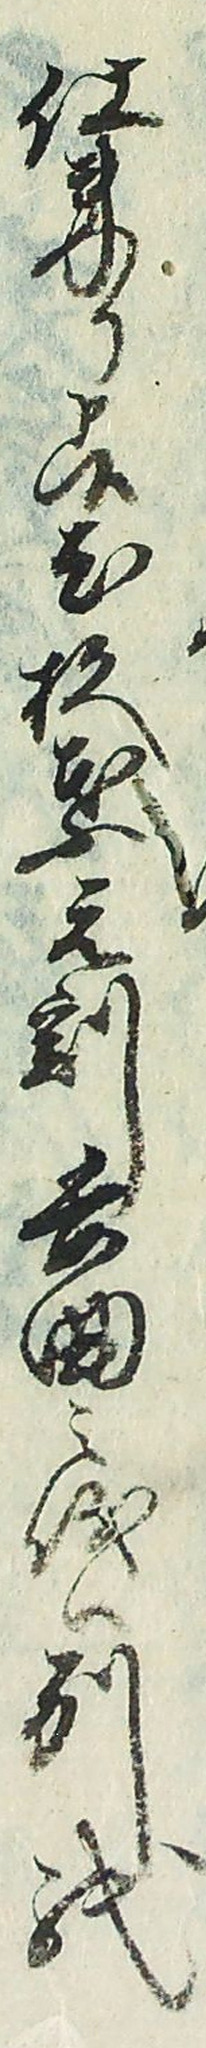仕来り申候尤杉葉元割委曲の儀は別紙
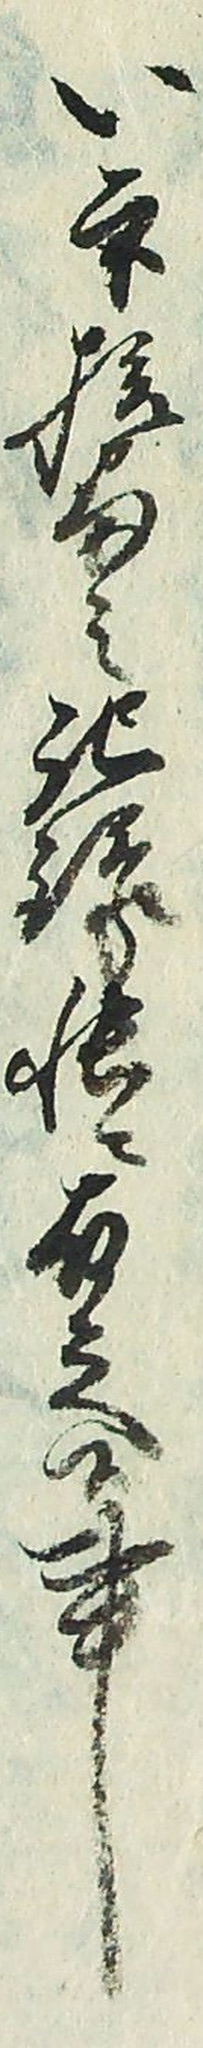い印拾番の記録帳に有之候事
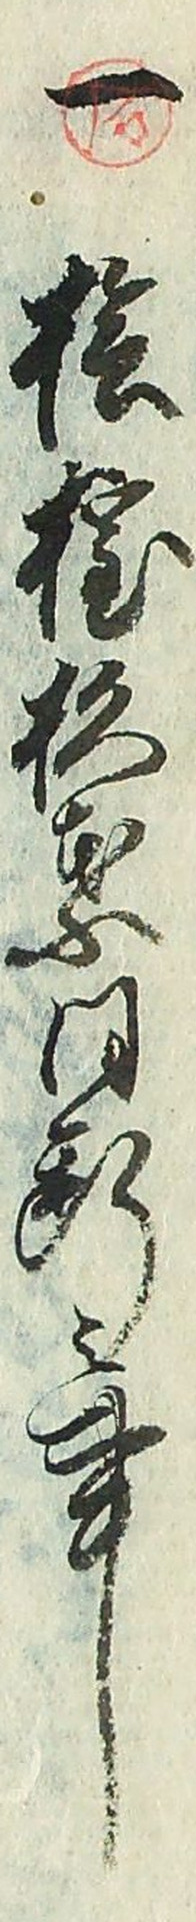一桧榁杉葉同断の事
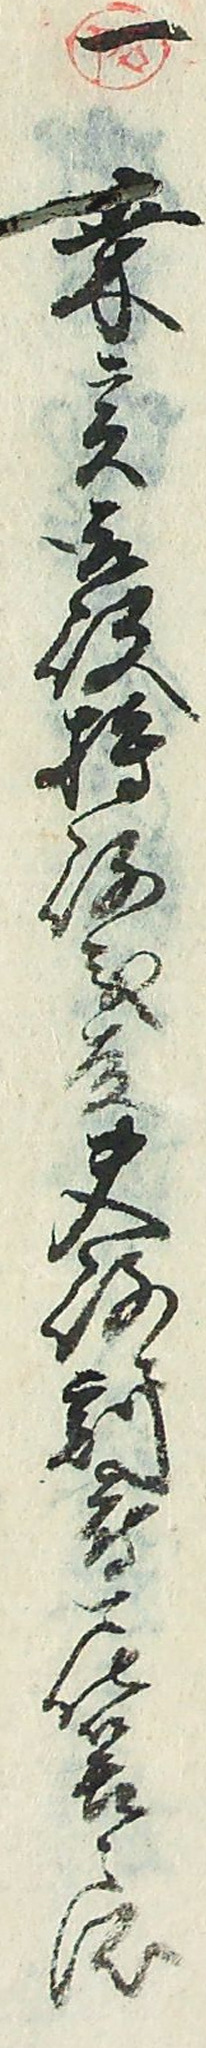一桑実取役持役義故夫役割符可仕筈の所

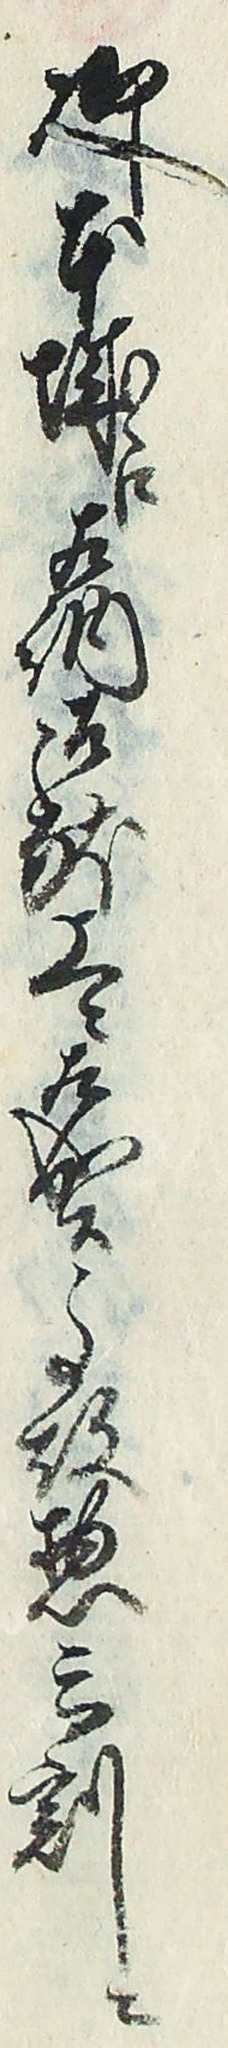御本城え相納ご献上に相成候事故惣高割賦に
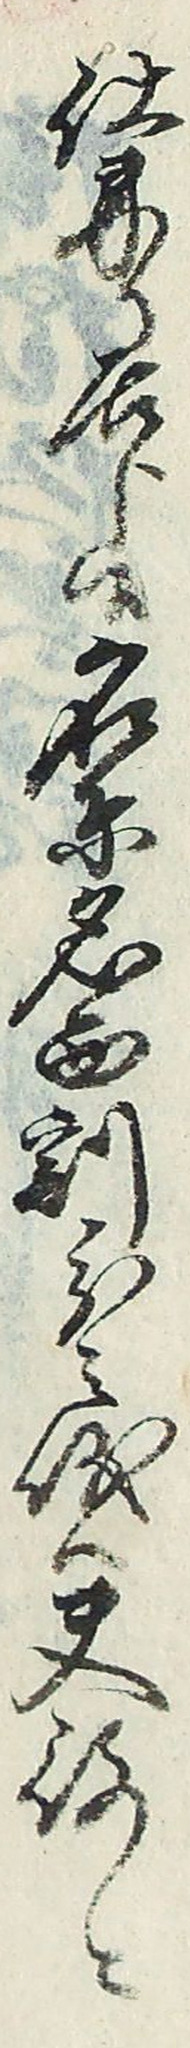仕来り居申候名東名西割分の儀は夫役に
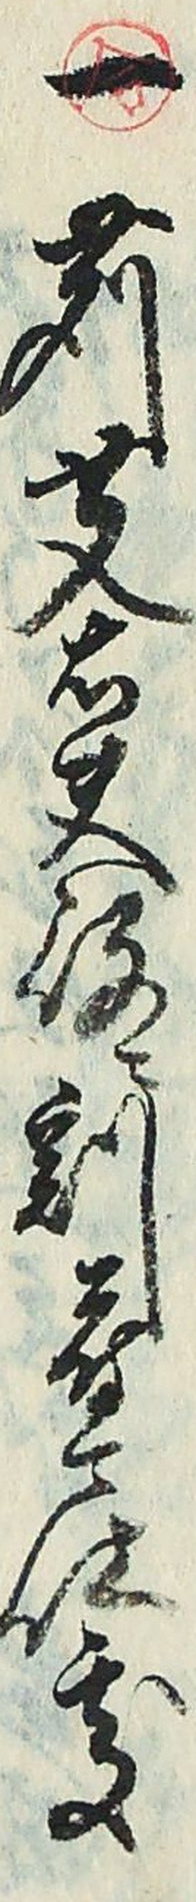一苅艾右夫役に割符可仕処
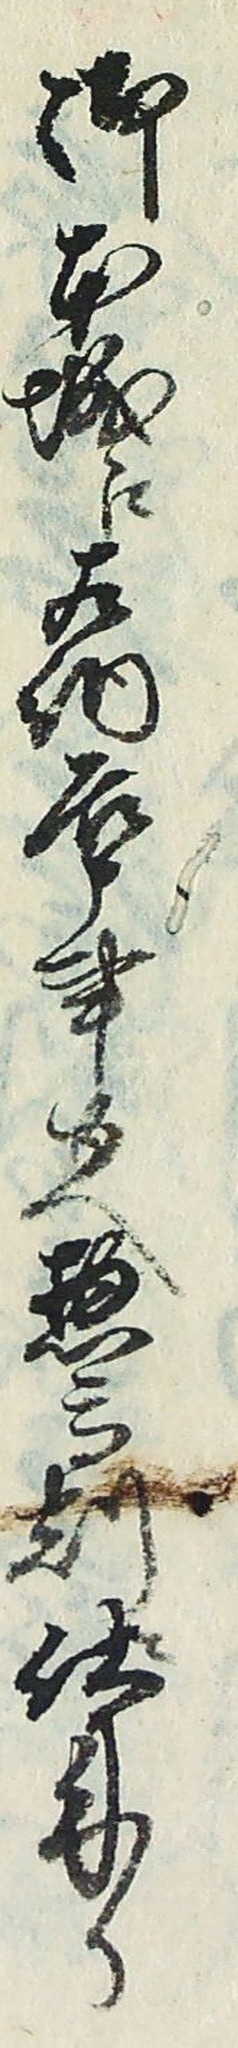御本城え相納居申事ゆへ惣高割に仕来り
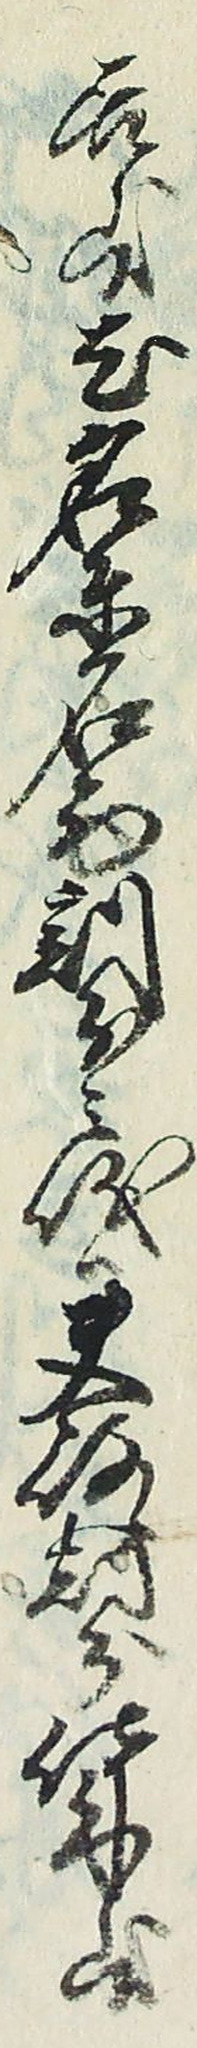居申候尤名東名西割分の儀は夫役割分仕来申候
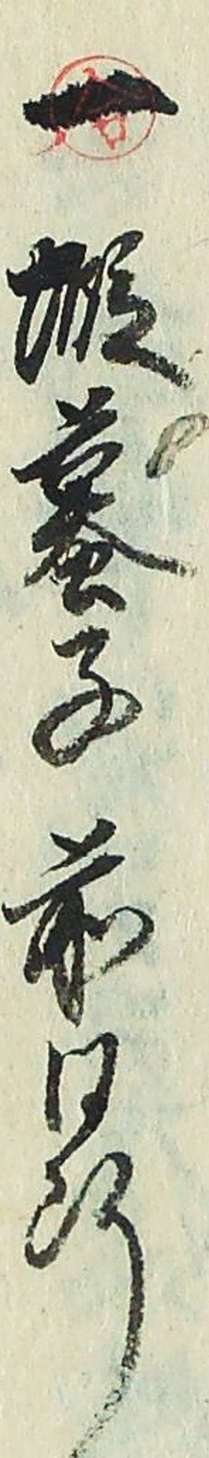一蝦蟇子前同断
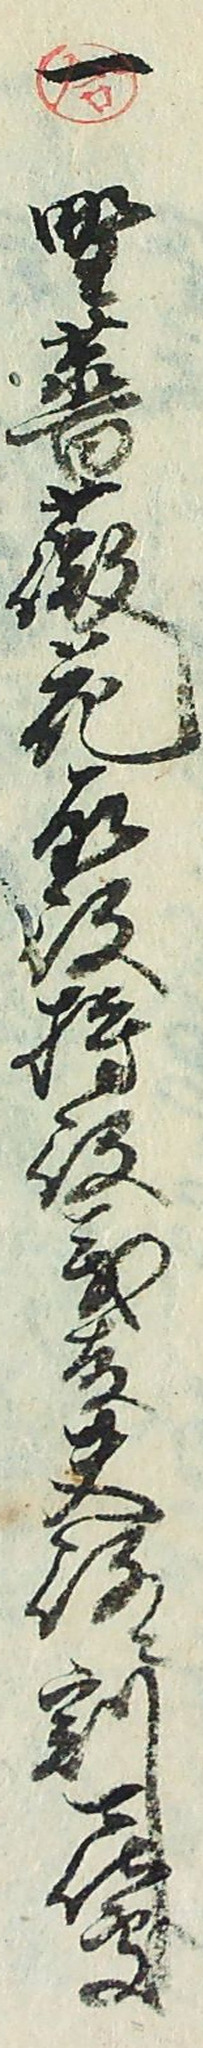一野薔薇花取役持役義故夫役に割可仕処
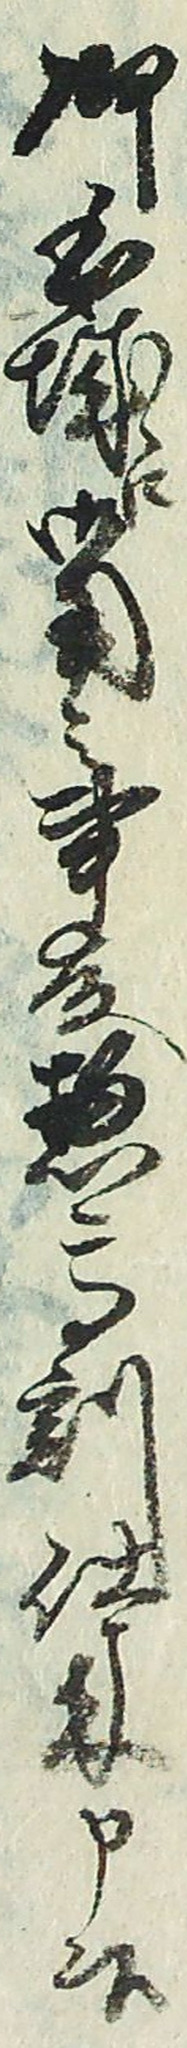御本城え御用の事故惣高割仕来申候
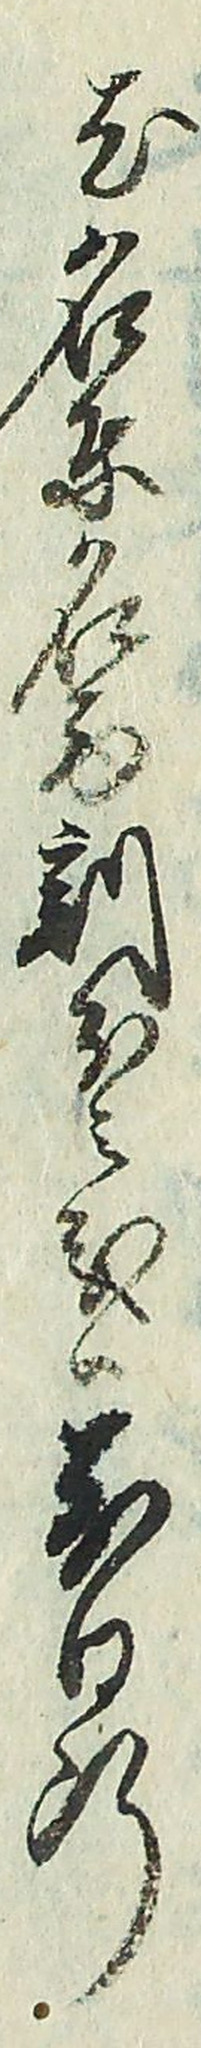尤名東名西割分の義は前同断
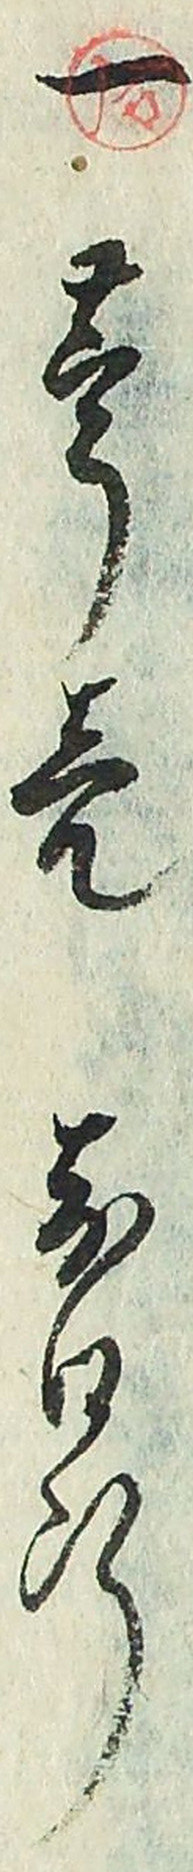一苧売前同断
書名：諸割賦物賃銀定記録帳
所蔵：鳴門教育大学 Naruto University of Education
